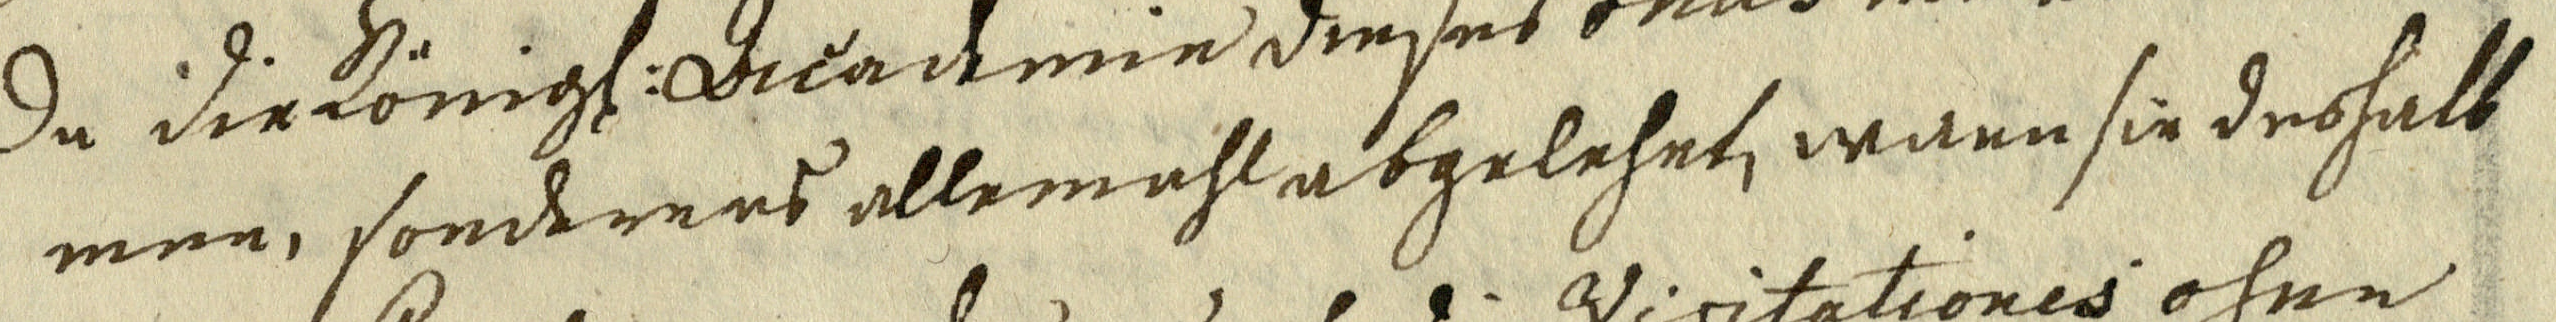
men, sondern es allemahl abgelehnt, wann sie deshalb
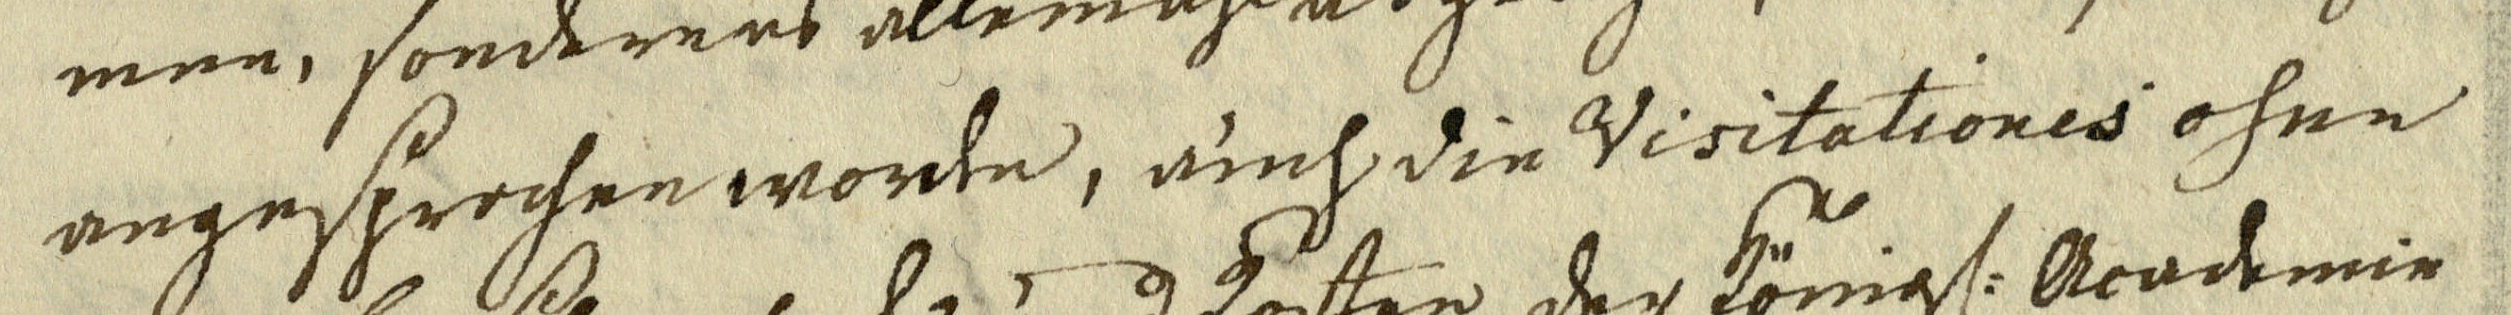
angesprochen worden, auch die Visitationes ohne
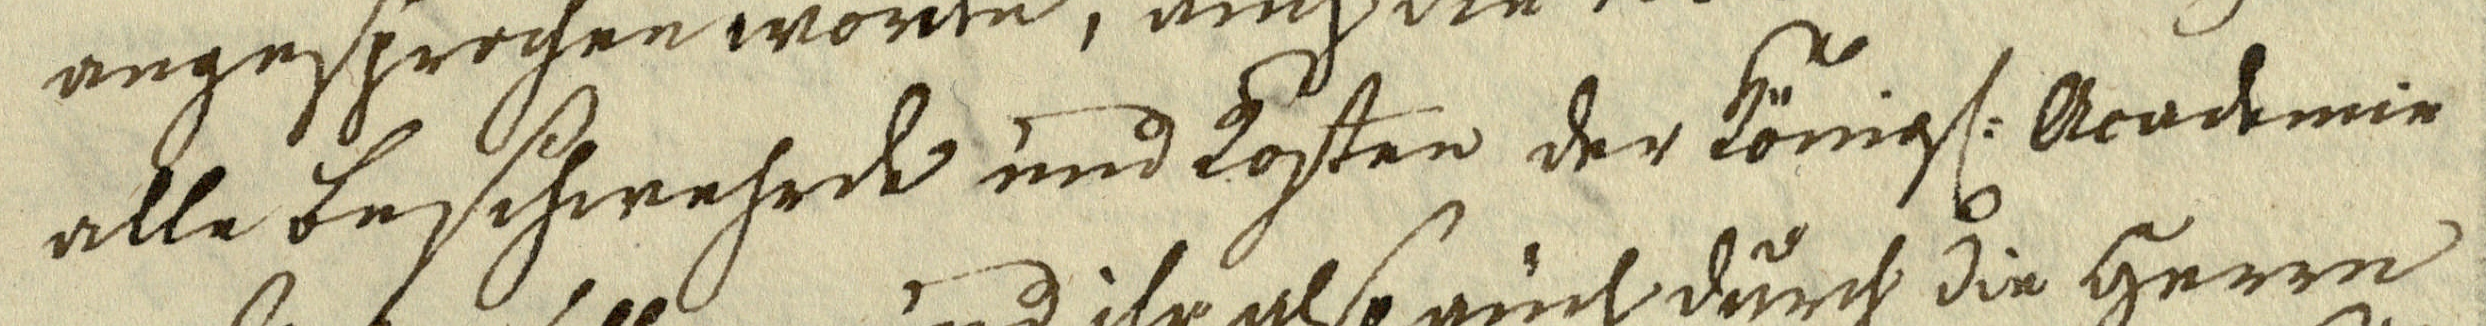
alle Beschwehrde und Kosten der Königl. Academie
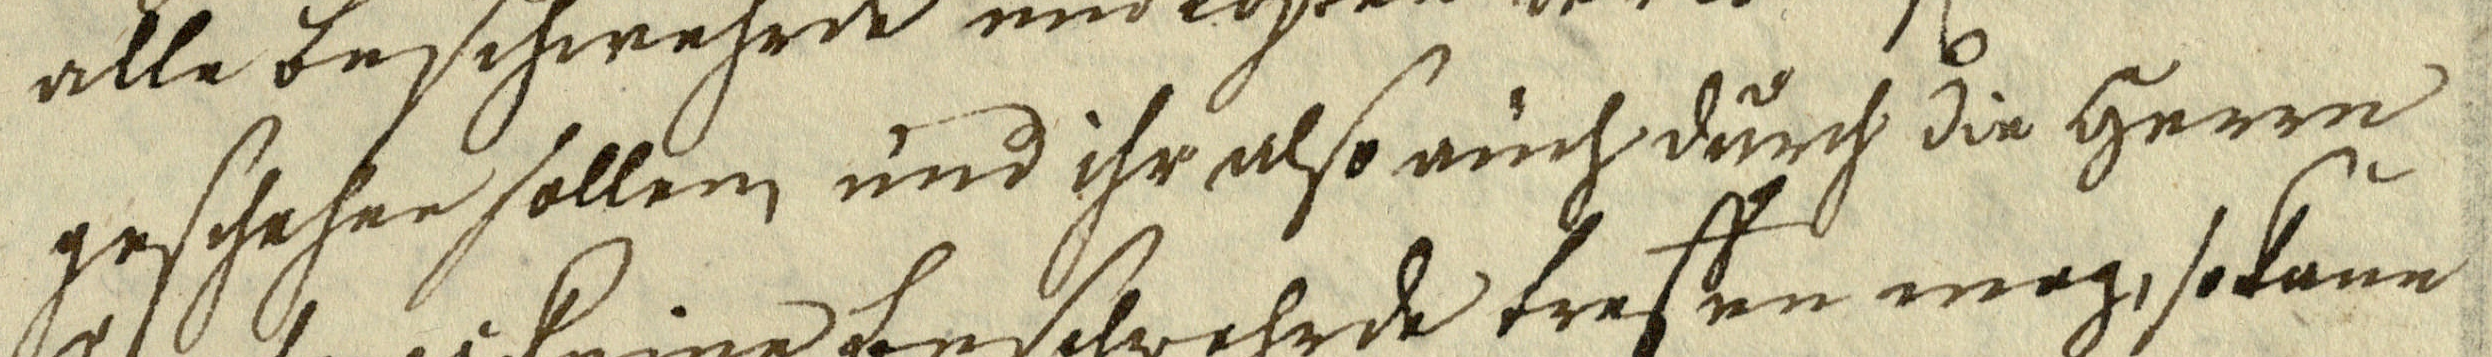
geschehen sollen, und ihr also auch durch die Herrn
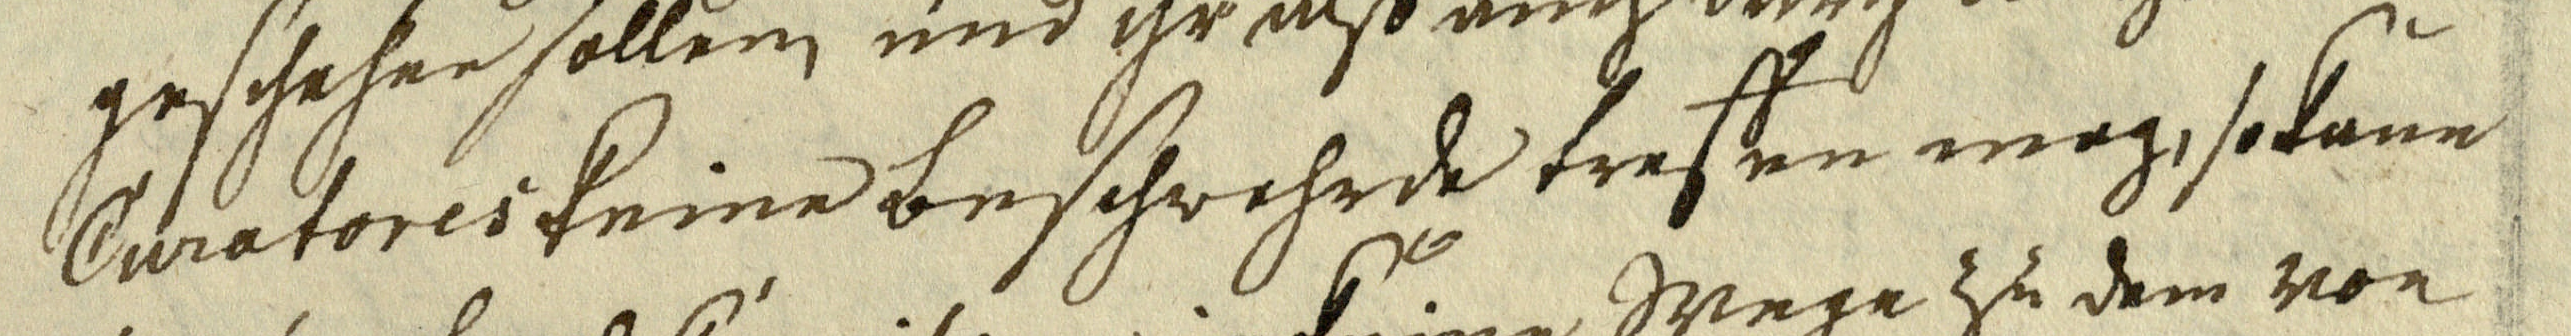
Curatores keine Beschwehrde treffen mag, so kann
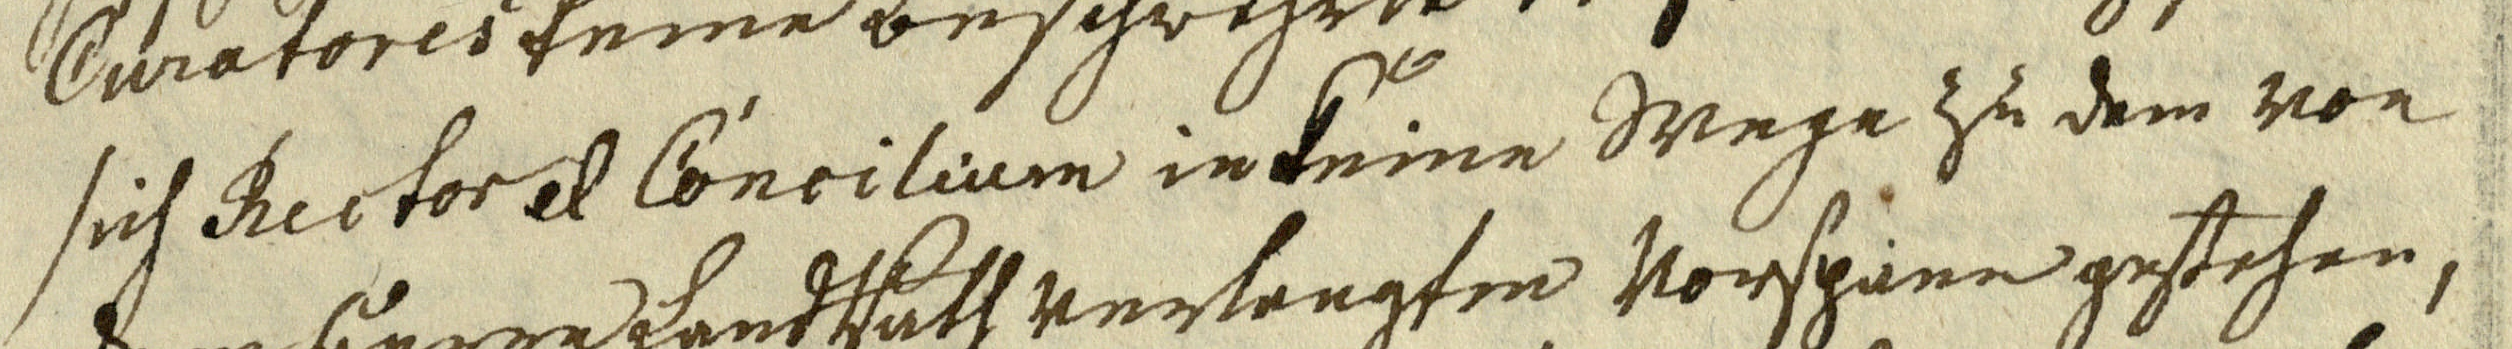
sich Rector et Concilium in keine Wege zu dem von
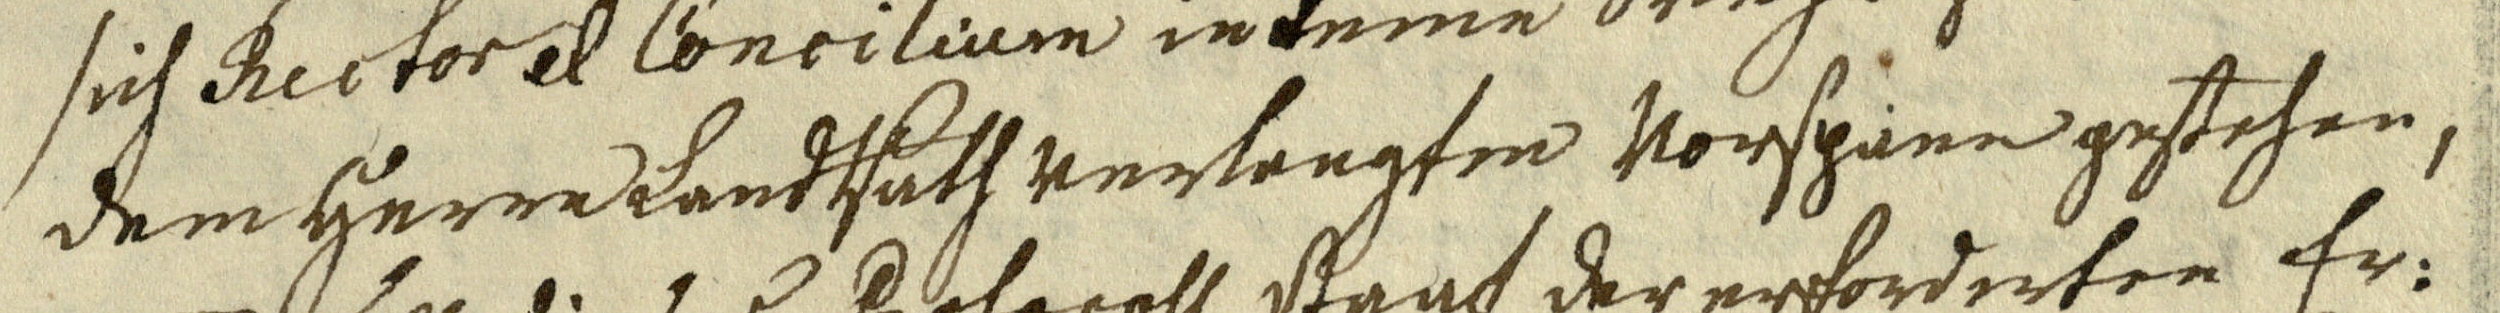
dem Herrn LandRath verlangten Vorspann gestehen,
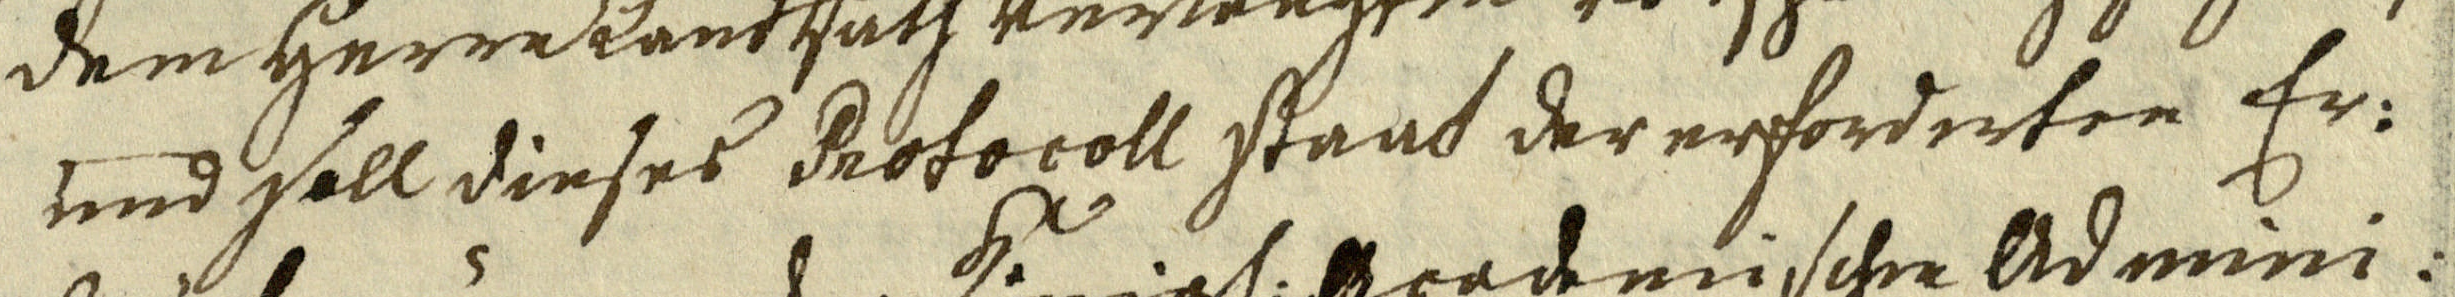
und soll dieses Protocoll staat der erforderten Er¬
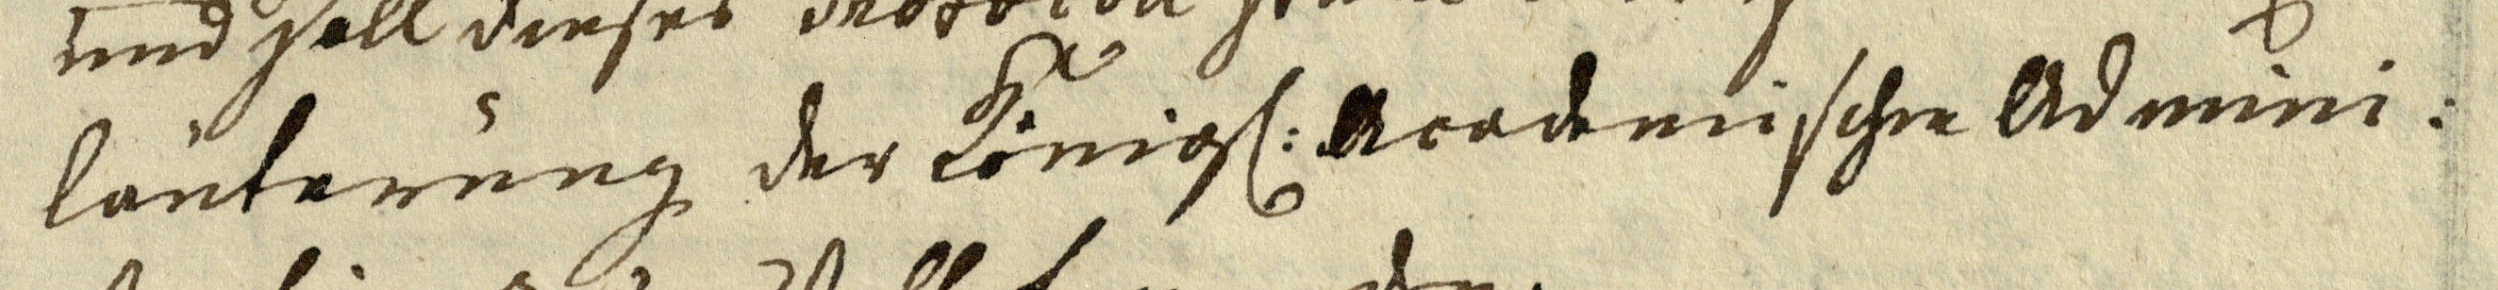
läuterung der Königl. Academischen Admini¬
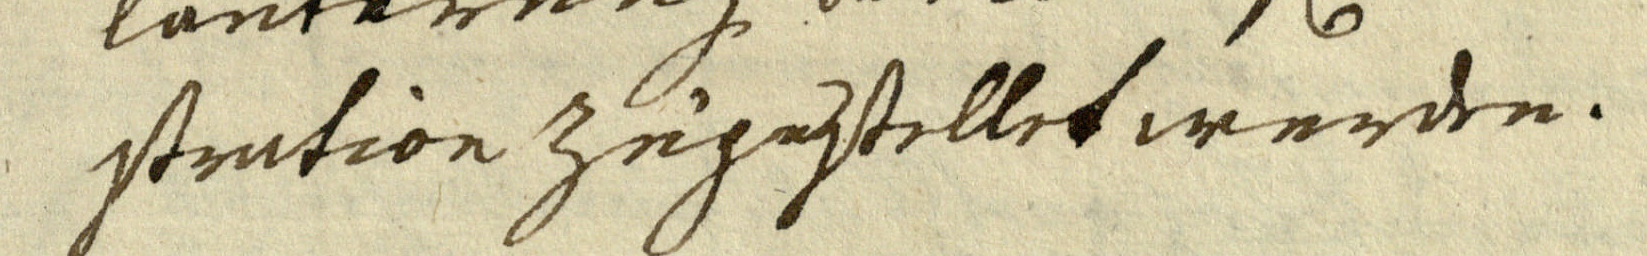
stration zugestellet werden.
